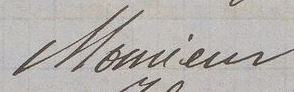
Monsieur
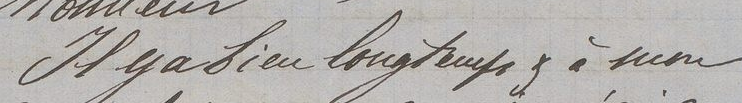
Il y a bien longtemps & à mon
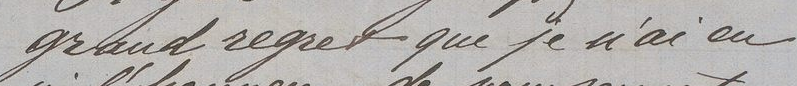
grand regret que je n'ai eu
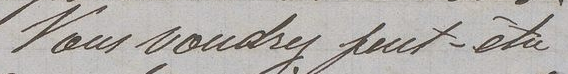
Vous voudrez peut-être
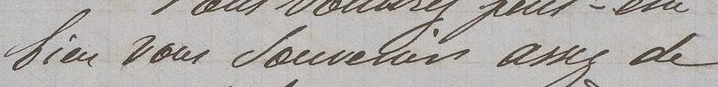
bien vous souvenir assez de
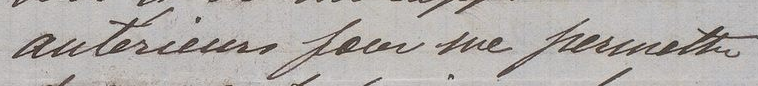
antérieurs pour me permettre
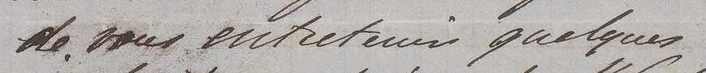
de vous entretenir quelques
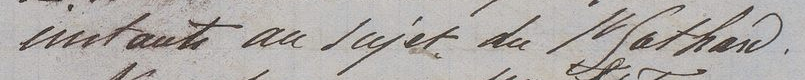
instants au sujet du St Gothard.
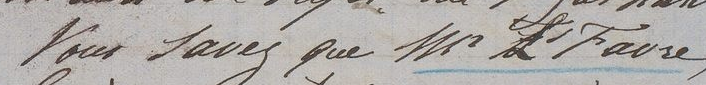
Vous savez que MrL Favre,
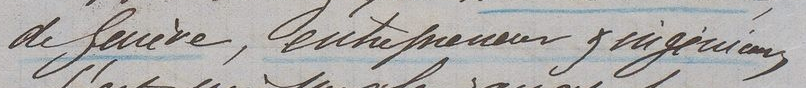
de Genève, entrepreneur & ingénieur
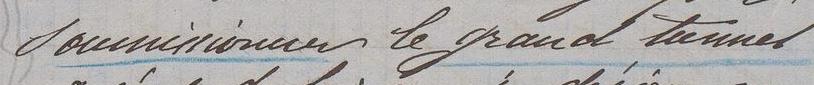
soumissionner le grand tunnel
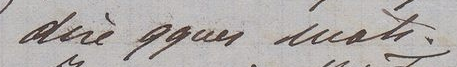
dire qques mots.
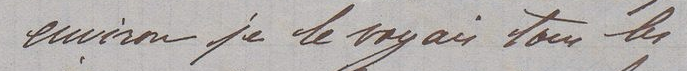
environ je le voyais tous les
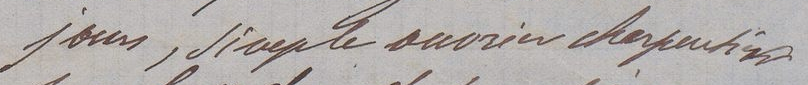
jours, simple ouvrier charpentier
